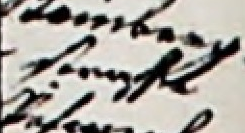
strasse
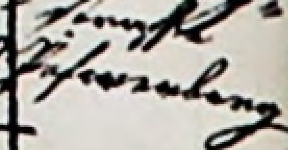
P???berg
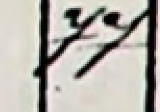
77
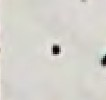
„
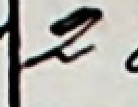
2
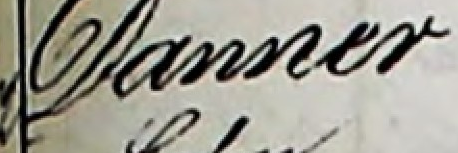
Danner
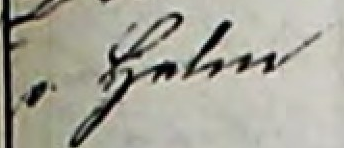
v. Helm
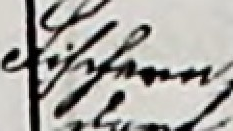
Fischern„
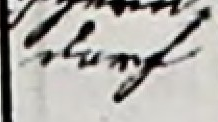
dorf
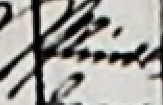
Pfindl„
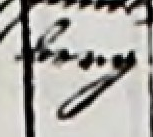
berg
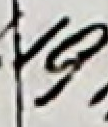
19
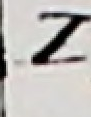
I
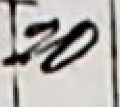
20
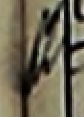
82
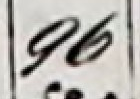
96
